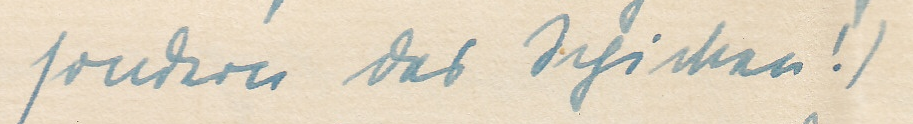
sondern des Schinkens)
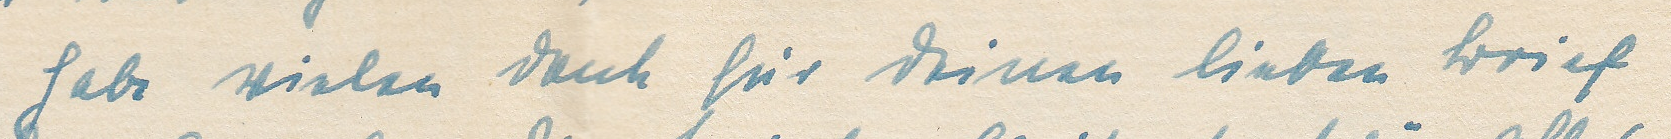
Hab vielen Dank für Deinen lieben Brief
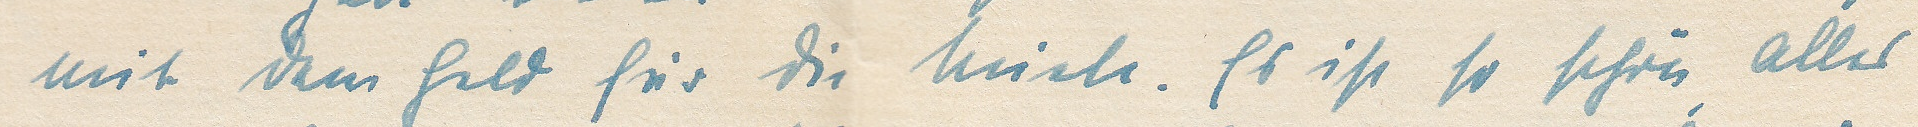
mit dem Geld für die Kinder. Es ist so schön alles
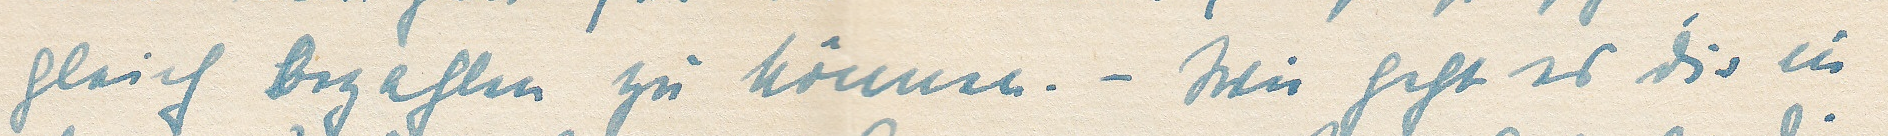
gleich bezahlen zu können. - Wie geht es Dir in
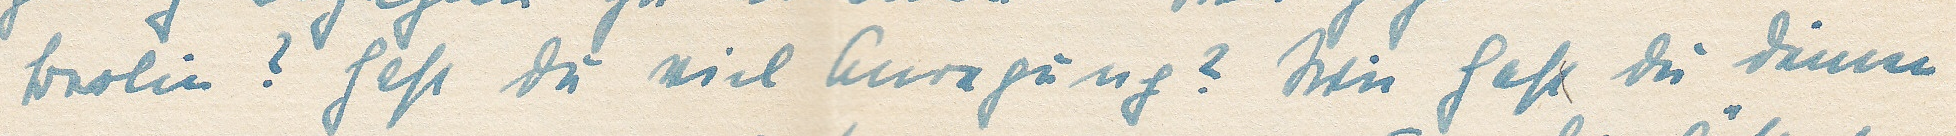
Berlin? Hast du viel Anregung? Wie hast Du Deinen
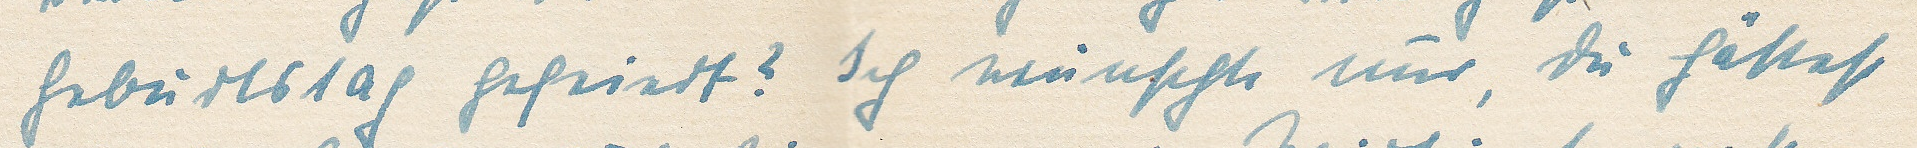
Geburtstag gefeiert? Ich wünschte nur, Du hättest
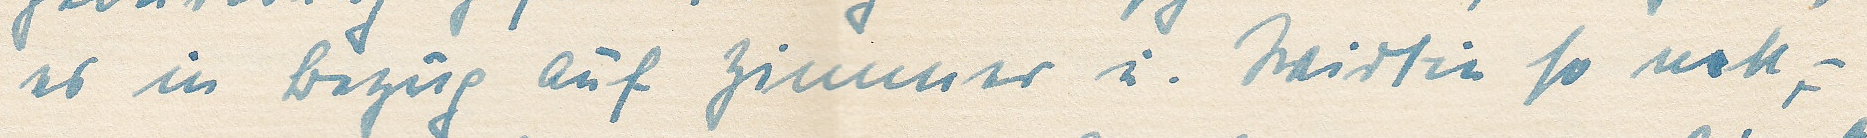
es in Bezug auf Zimmer i. Wirtin so wohl
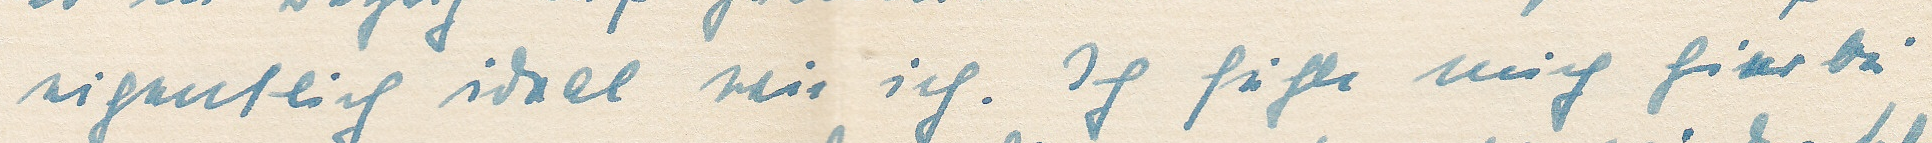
eigentlich ideal wie ich. Ich fühle mich hier bei
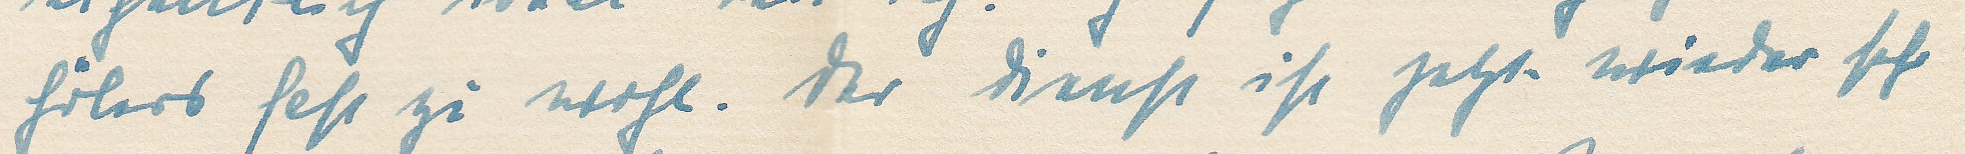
Gerhard fast zu wohl. Der Dienst ist jetzt wieder sehr
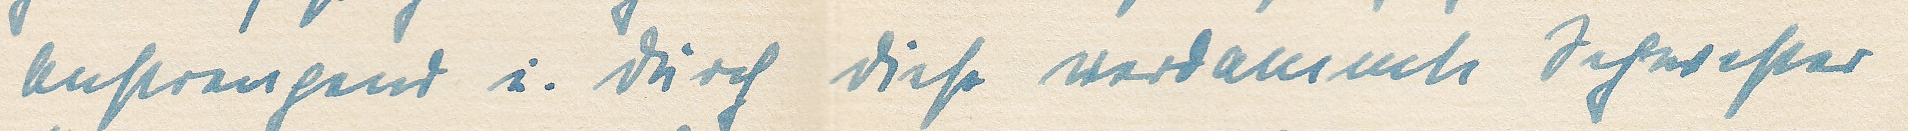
anstrengend u. durch diese verdammte Schwester
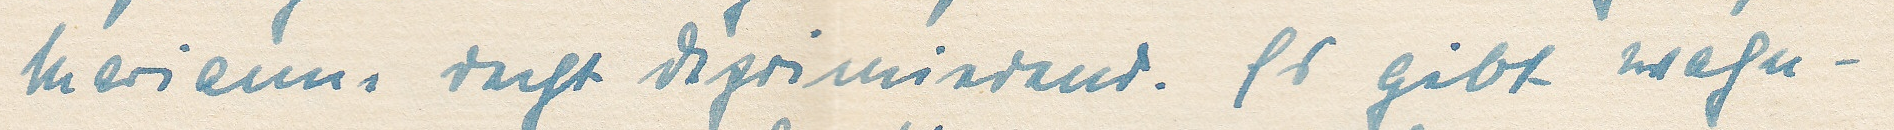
Marianne recht deprimierend. Es gibt wahn-
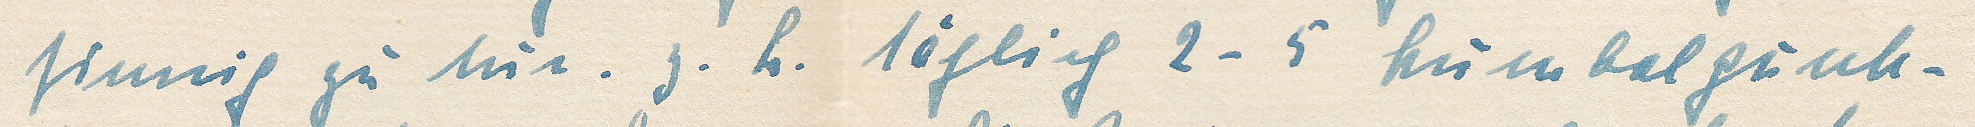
sinnig zu tun. z. B. täglich 2 - 5 kur u. balgu ak-
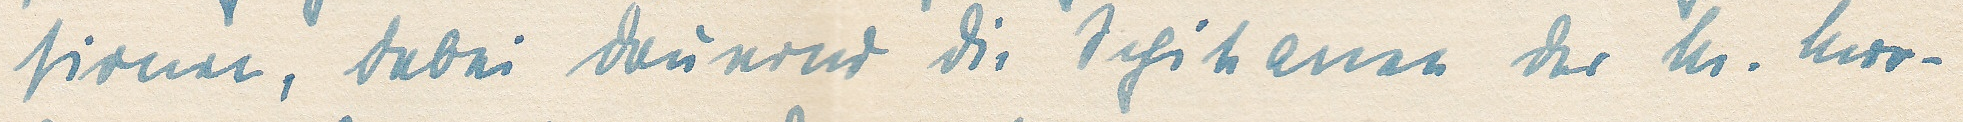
tionen, dabei dauernd die Schikanen der k. kro
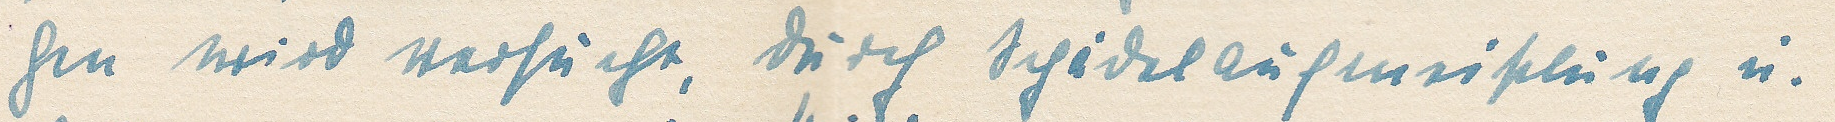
hen wird versucht, durch Schädelaufmeißelung u.
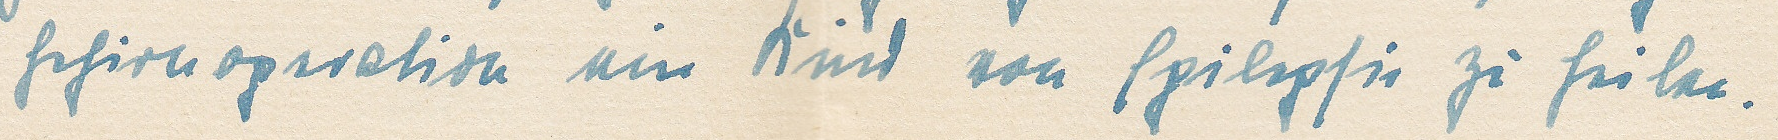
Gehirnoperation ein Kind von Epilepsie zu heilen.
